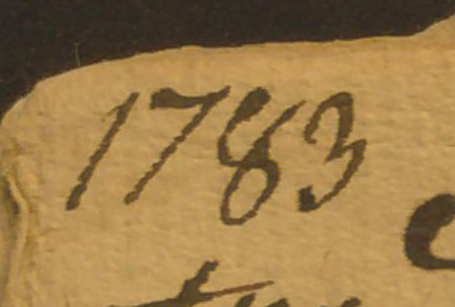1783
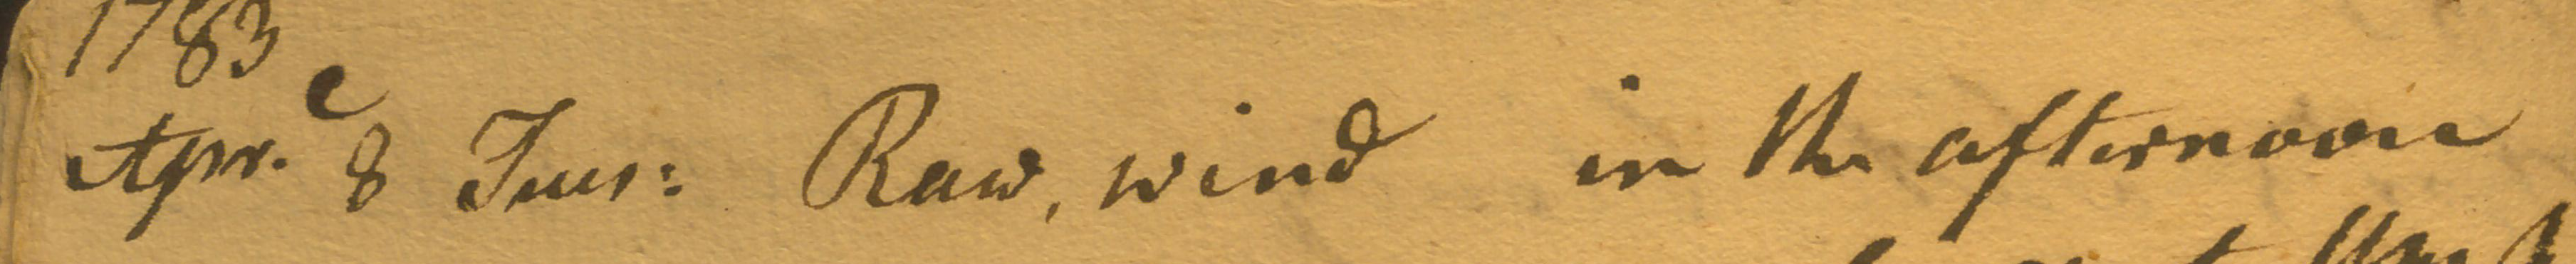Apr^l. 8 Tues: Raw, wind in the afternoon
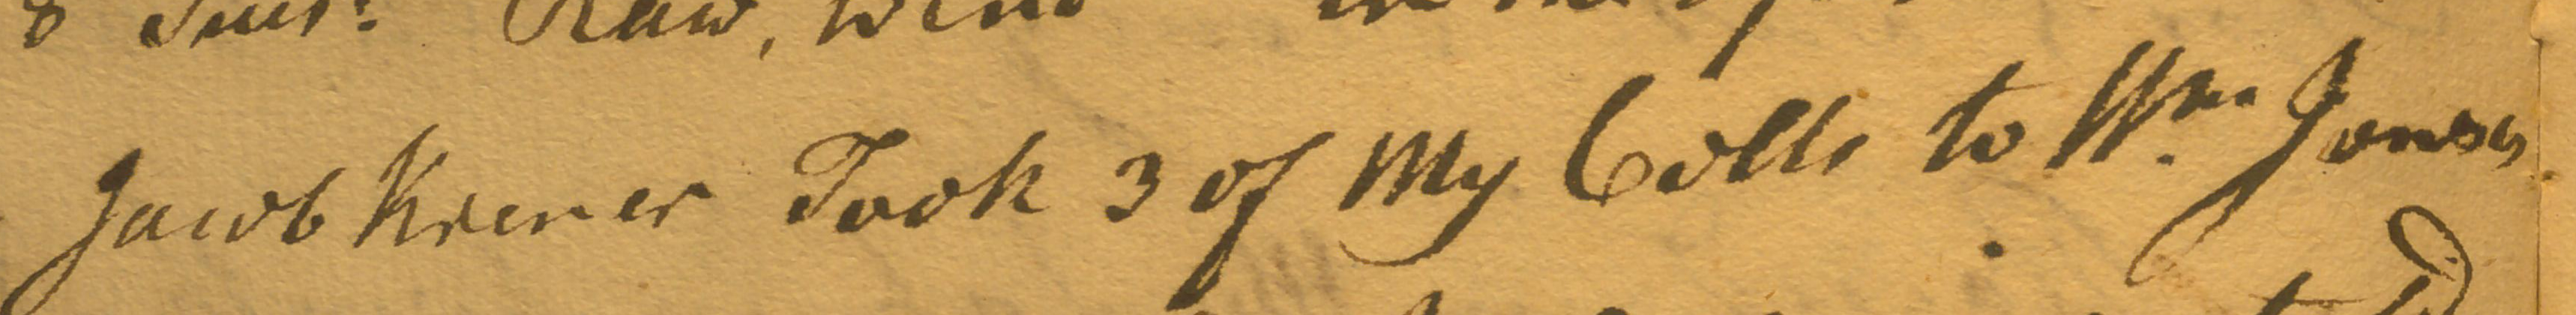Jacob Krener Took 3 of My Cows to W^m. Jonses
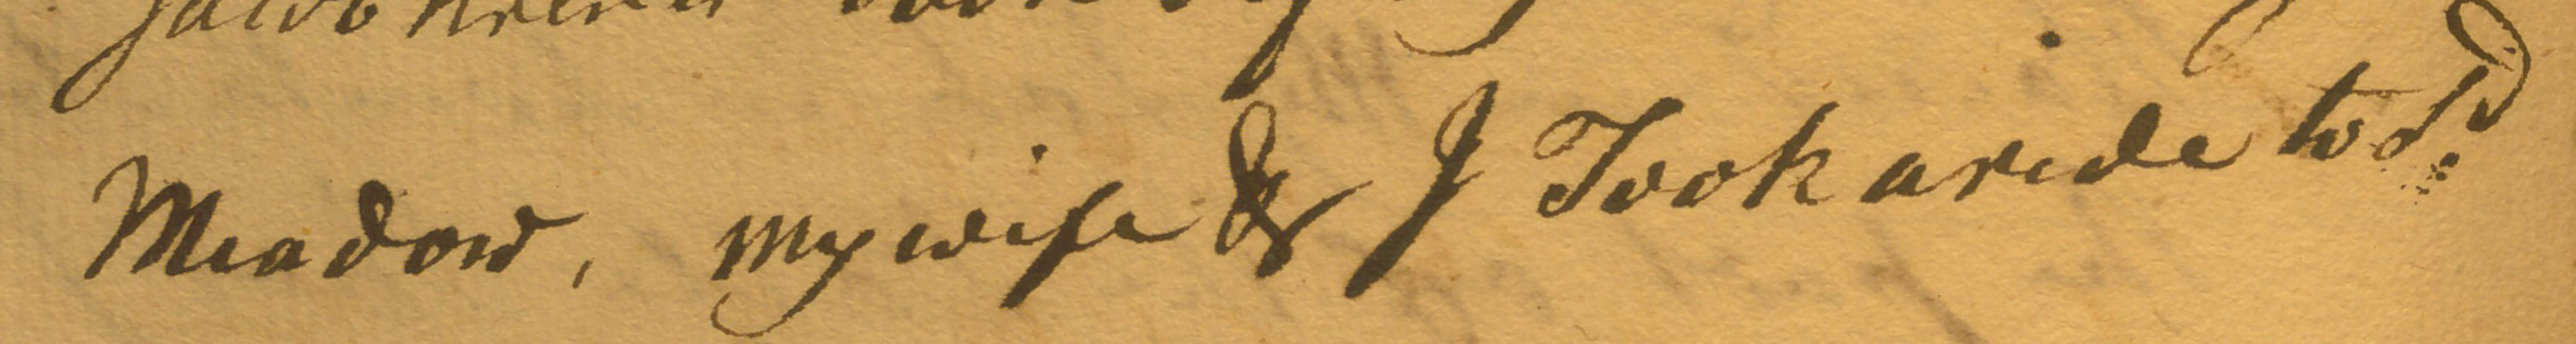Meadow, my wife & I Took a ride to s^d.
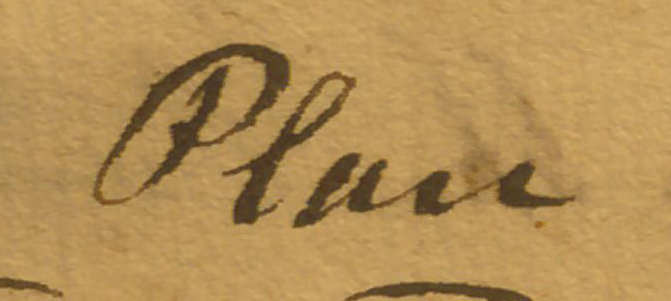Place
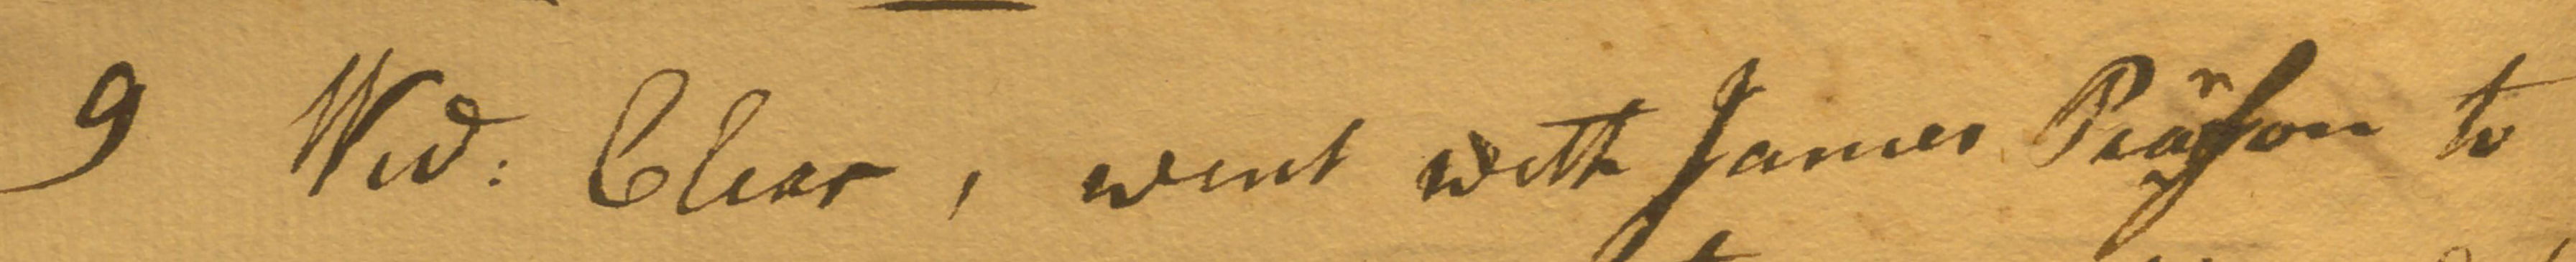9 Wed. Clear, went with James Pea^rson to
